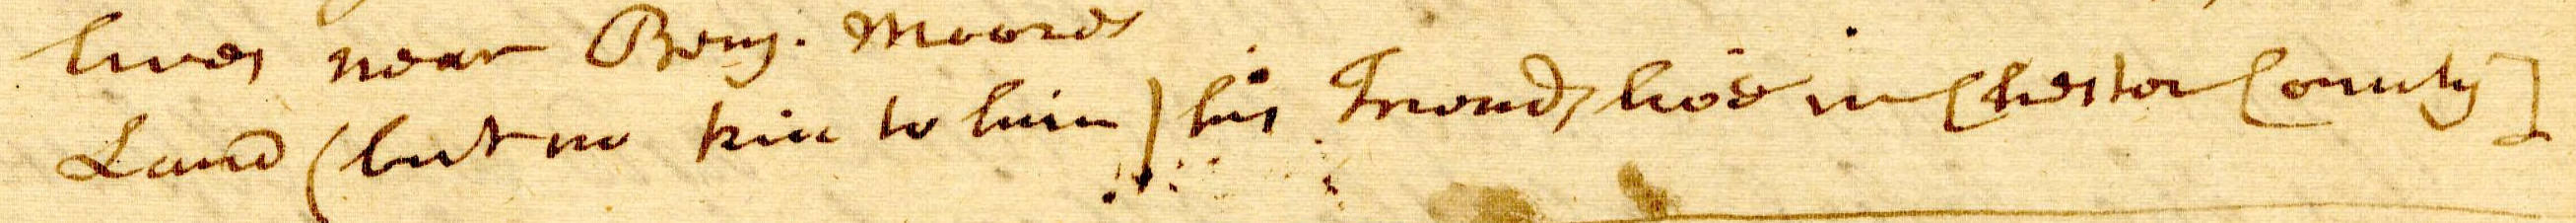Land (but no kin to him) his Friends live in Chester County)
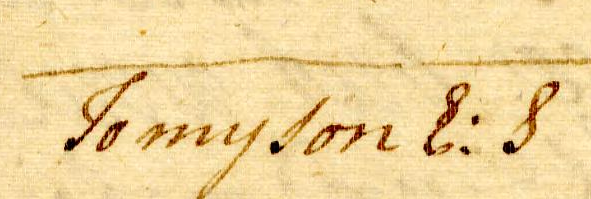To my Son E:S
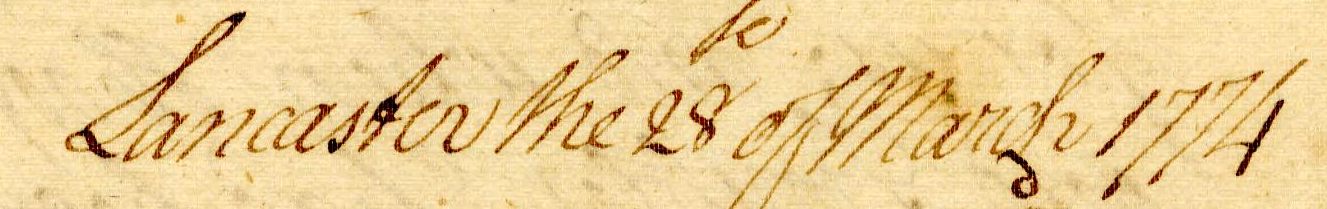Lancaster the 28^th of March 1774
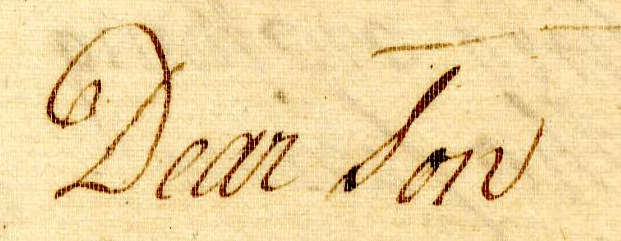Dear Son
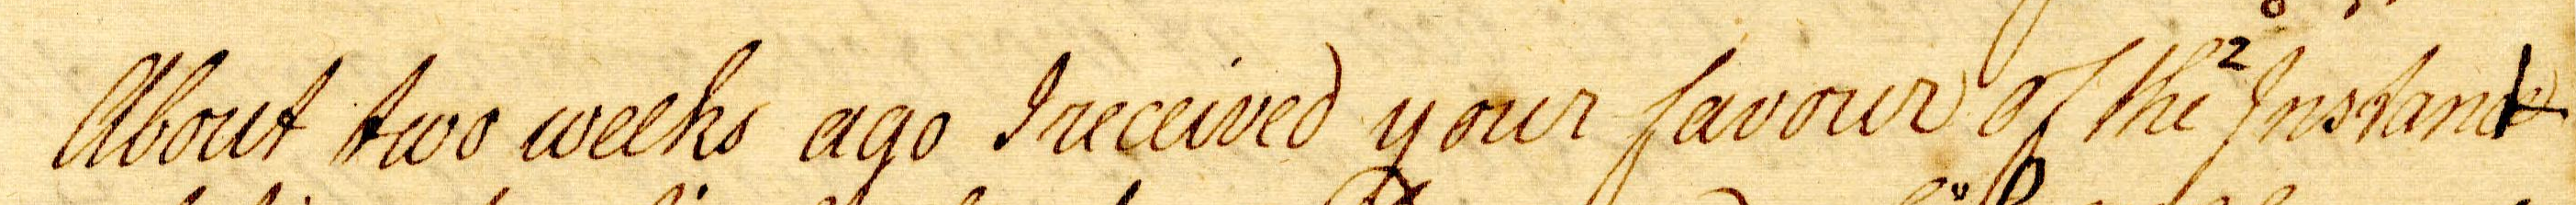About two weeks ago I received your favour of the ^2^d Instant
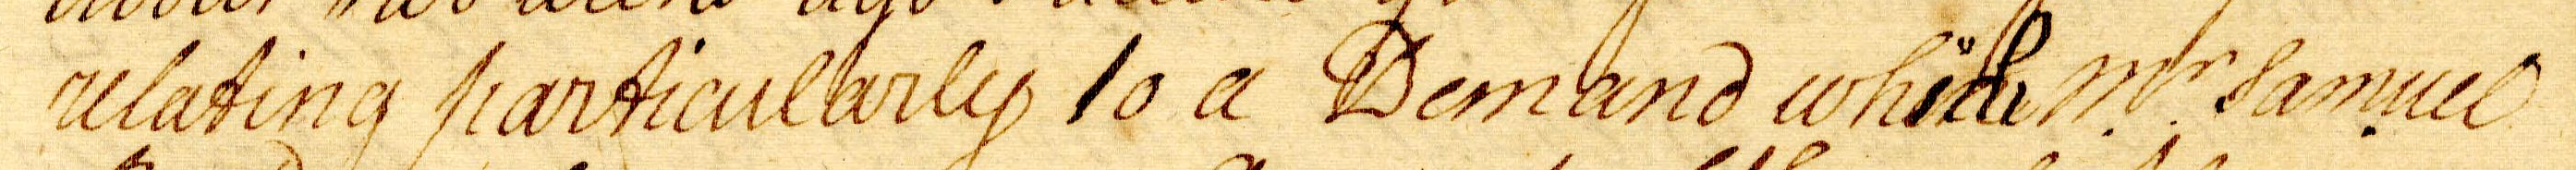relating particularly to a Demand which M^r. Samuel
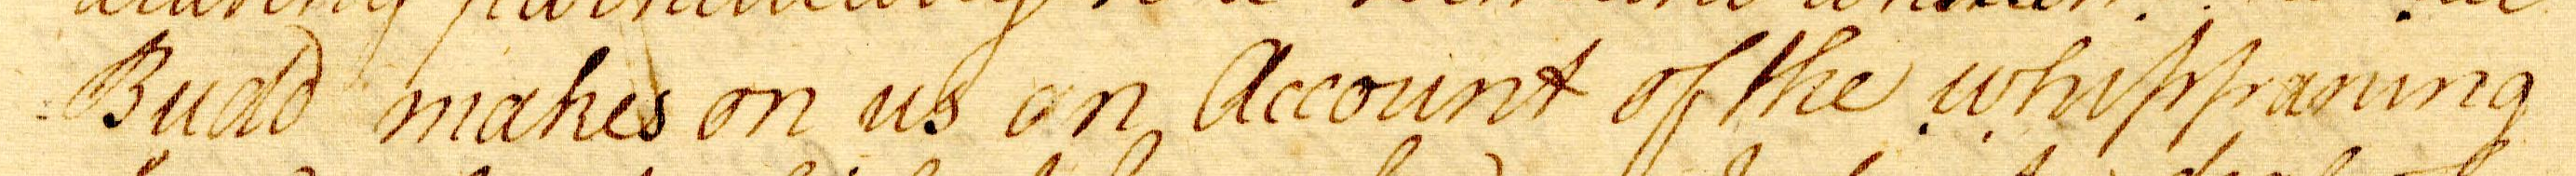Budd makes on us an Account of the whippaning
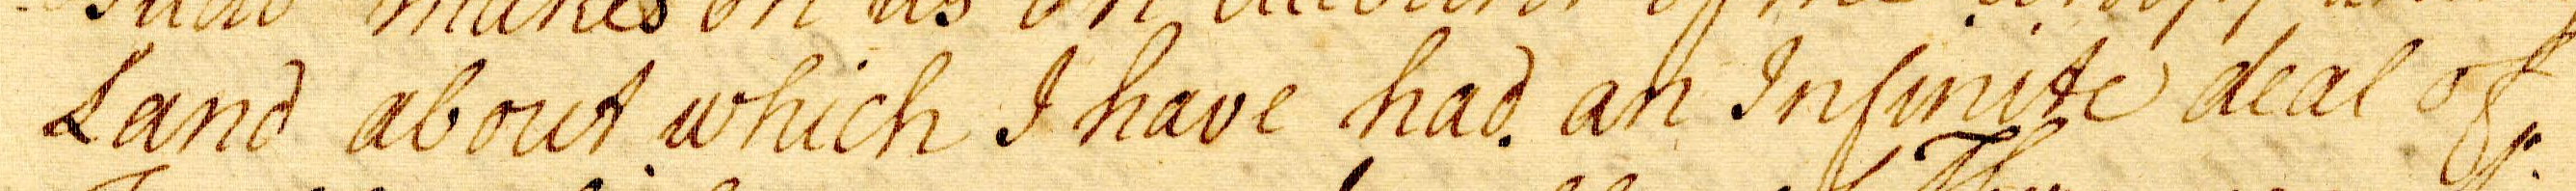Land about which I have had an Infinite deal of
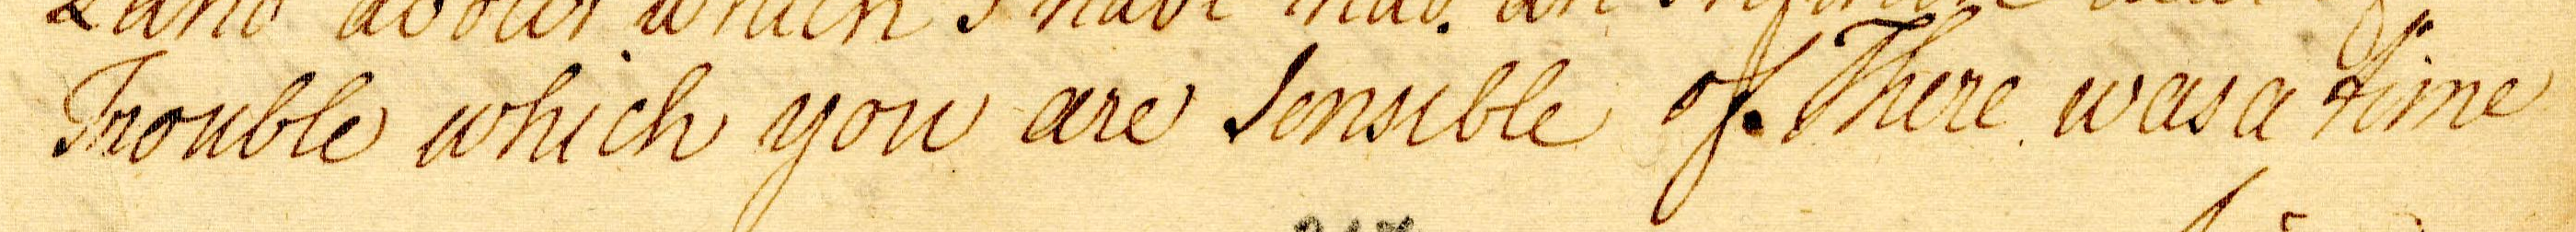Trouble which you are Sensible of. There was a time
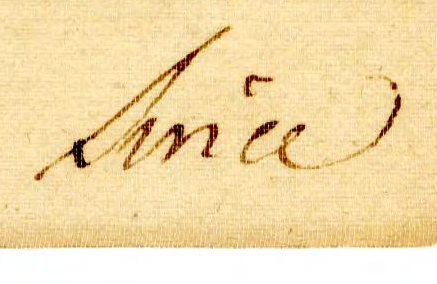Since
